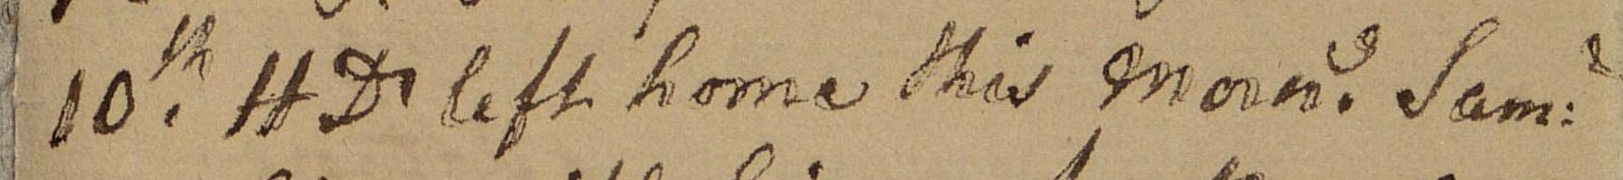10^th. HD left home this morn^g. Sam:^l
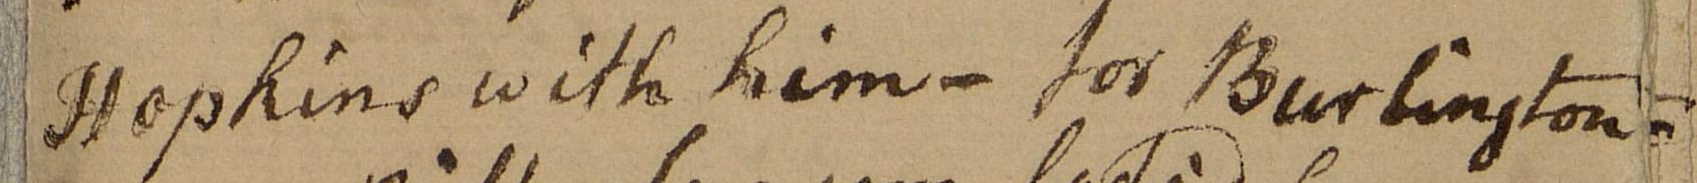Hopkins with him- for Burlington
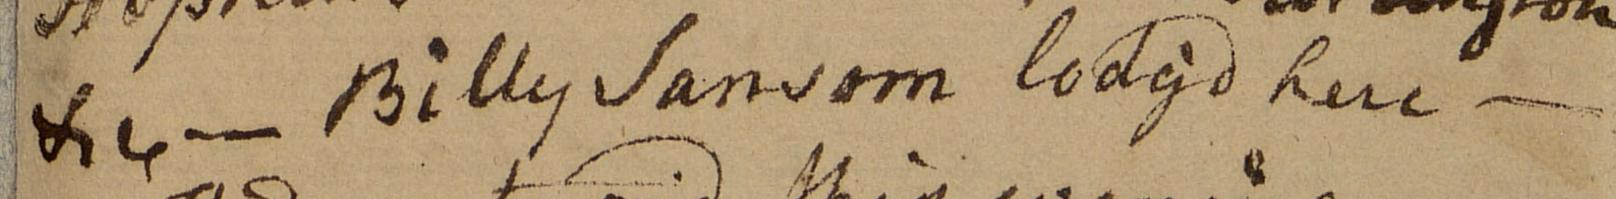&c- Billy Sansom lodg'd here-
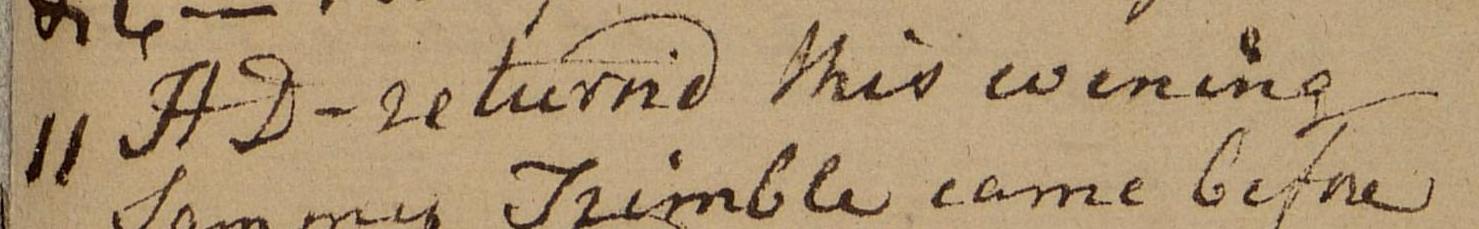11 HD- return'd this evening-
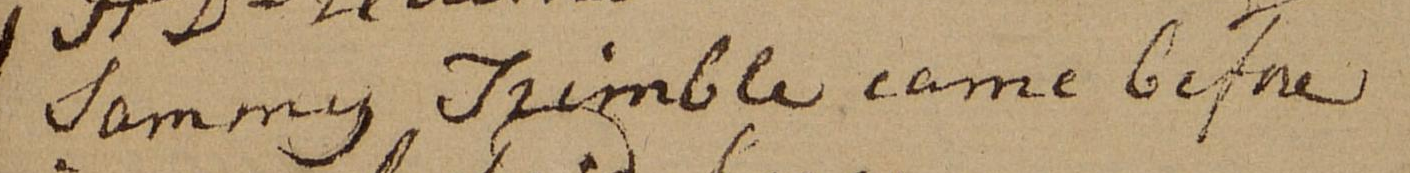Sammy Trimble came before
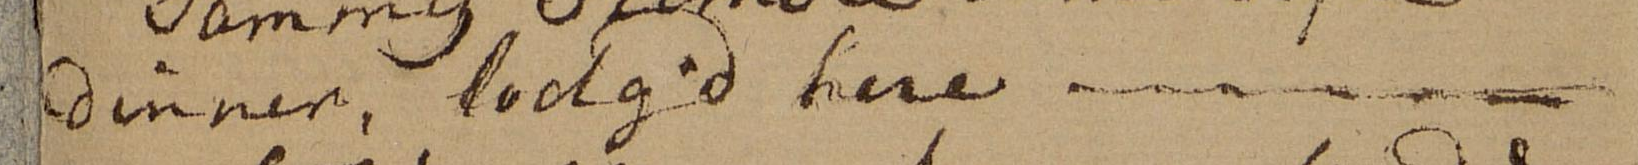dinner, lodg'd here--
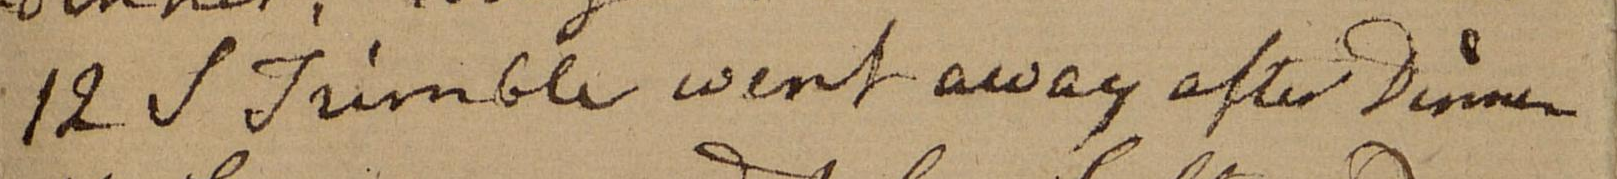12 S Trimble went away after Dinner
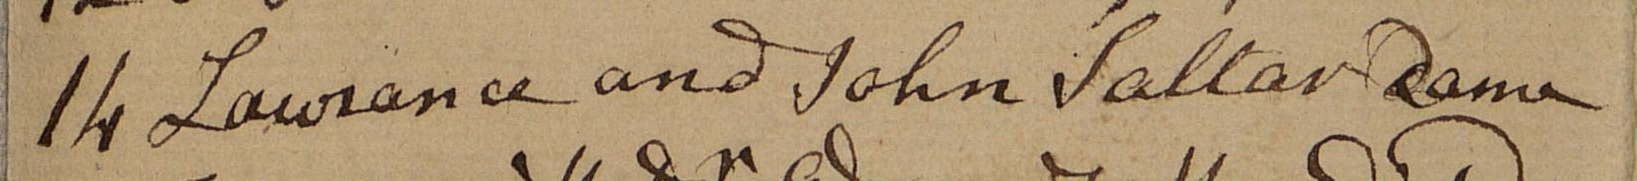14 Lawrance and John Saltar came
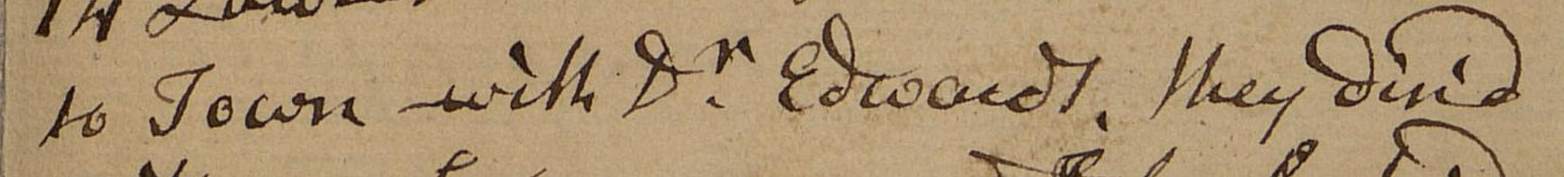to Town-with D^r. Edwards, they din'd
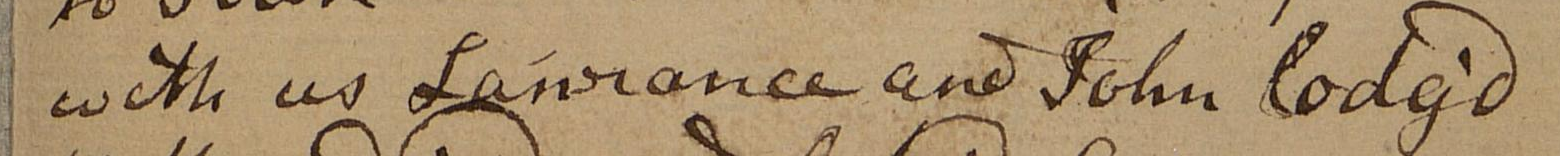with us Lawrance and John lodg'd
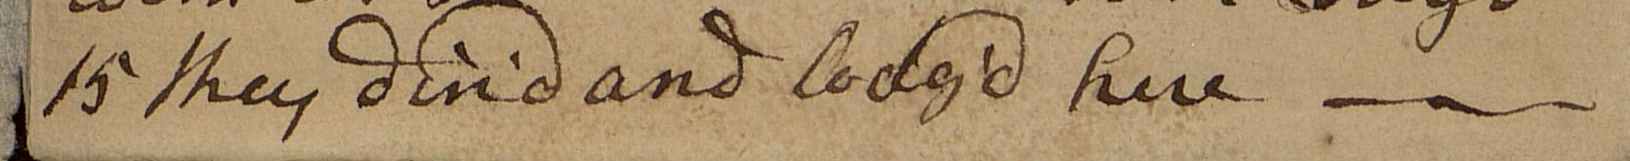15 they din'd and lodg'd here-
